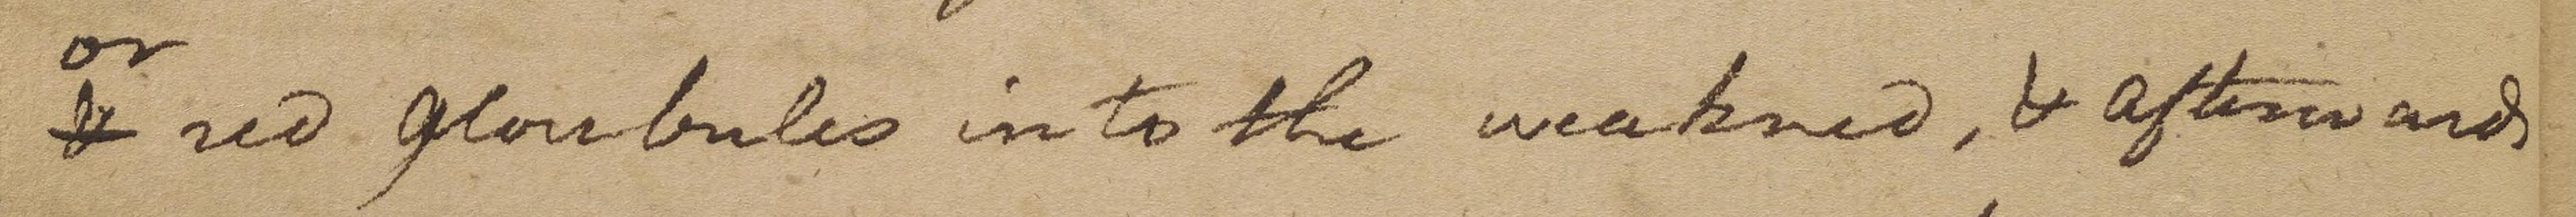[&] red gloubules in to the weakened, & after and
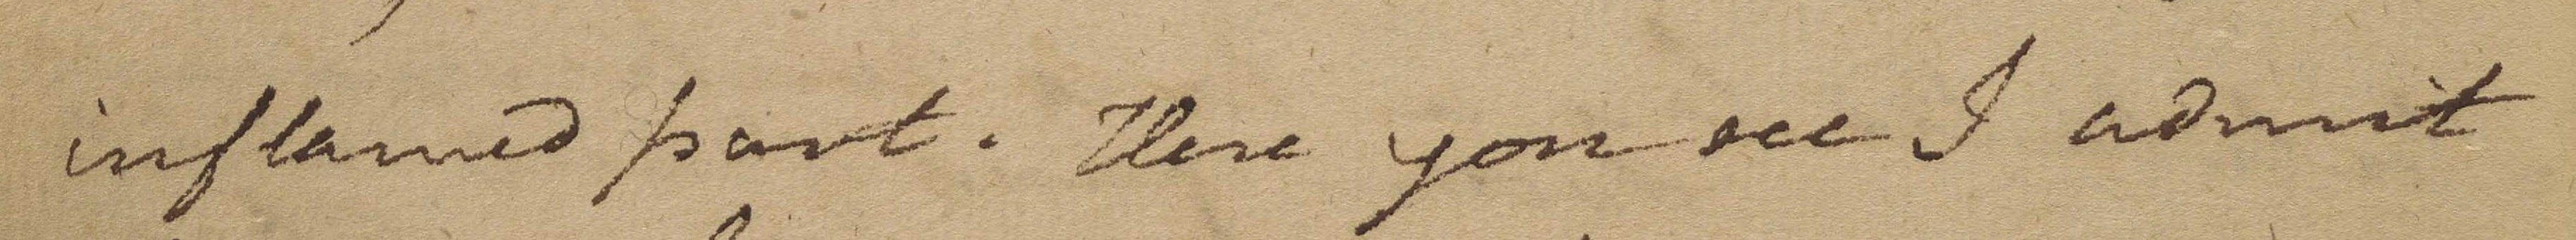inflamed part. Here you see I admit
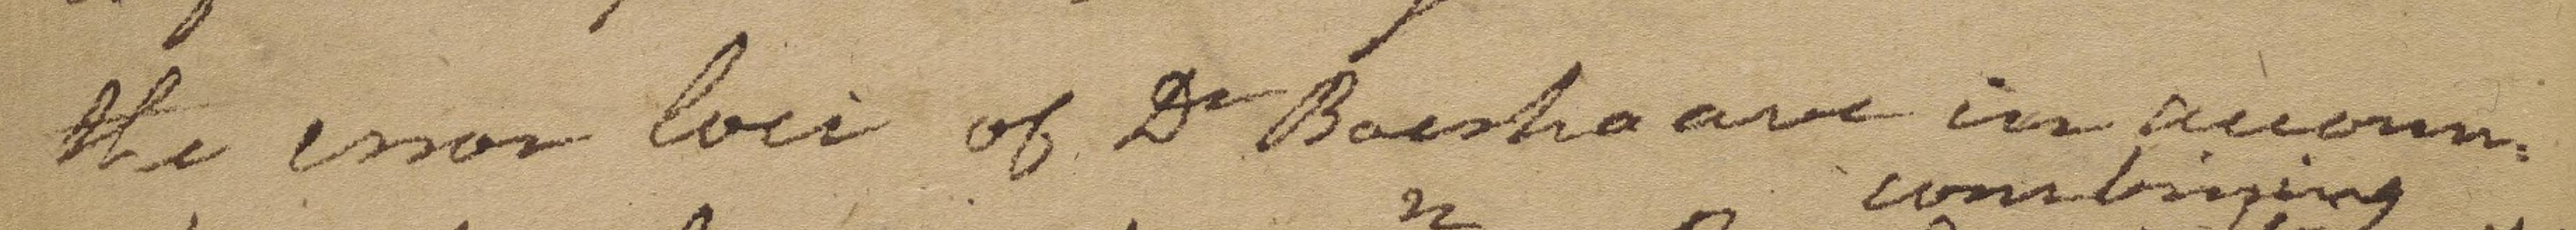the error loci of D^r Boerhaave in accoun-
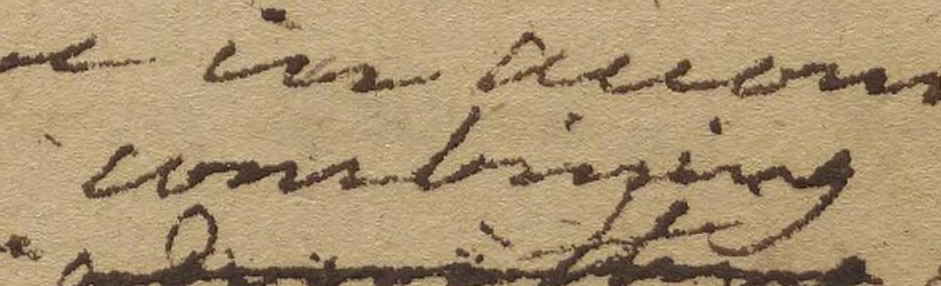combining
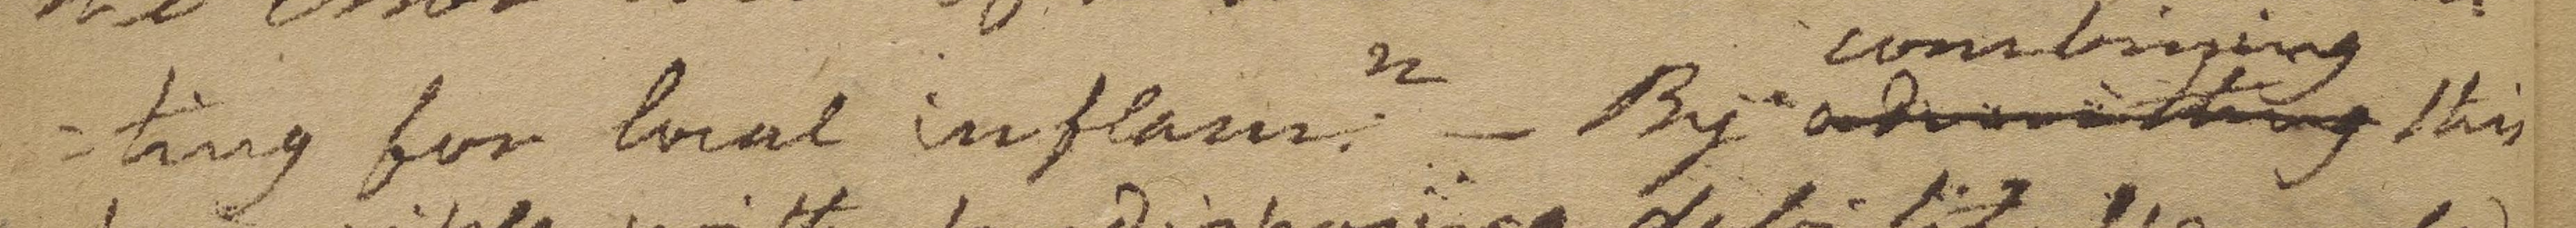ting for local inflam^n.- By [admitting] this
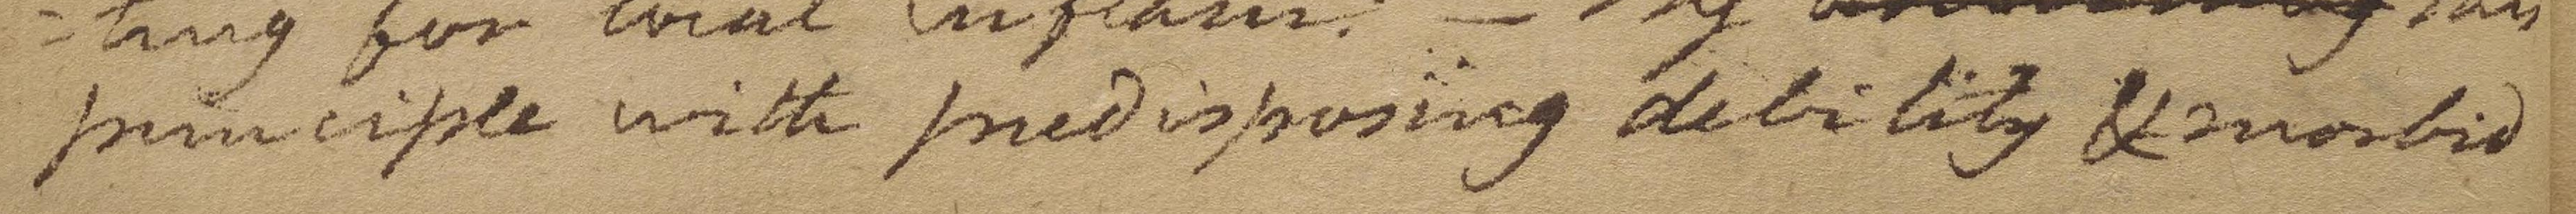principle with predisposing debility & morbid
